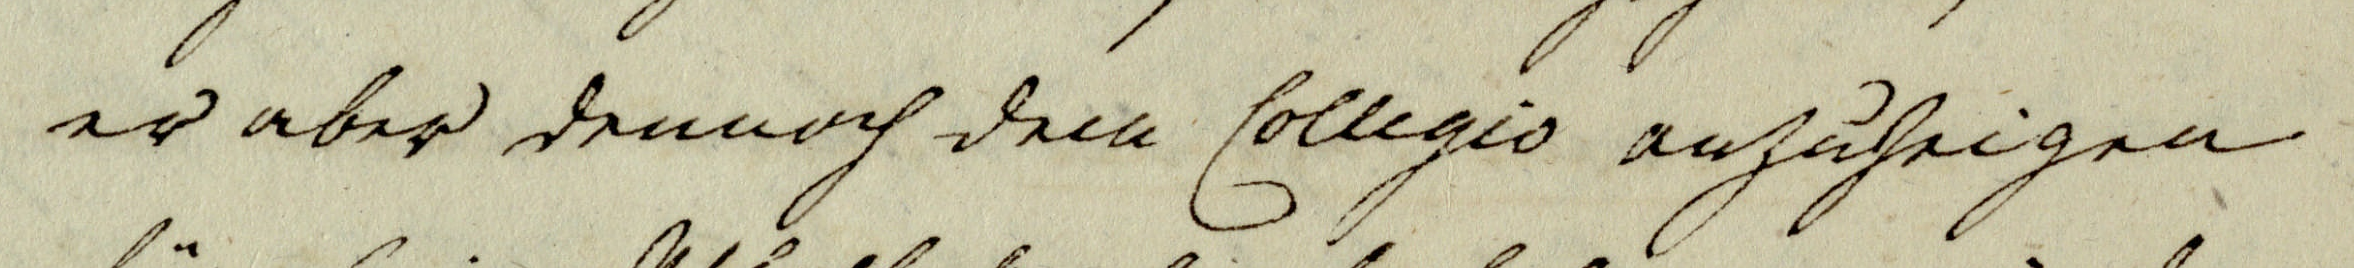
er aber dennoch dem Collegio anzuzeigen
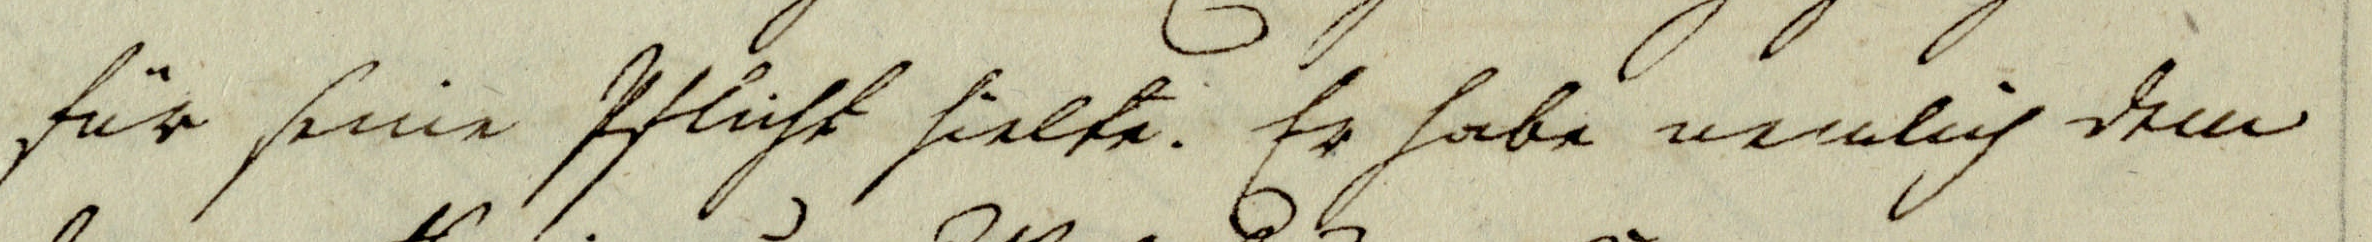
für seine Pflicht hielte. Er habe nemlich dem
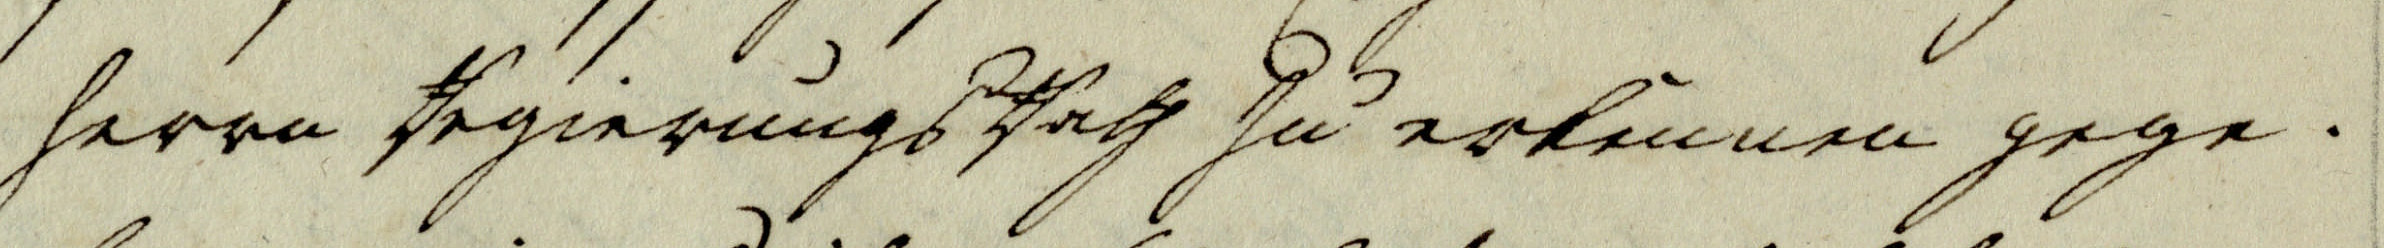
Herrn Regierungs Rath zu erkennen gege¬
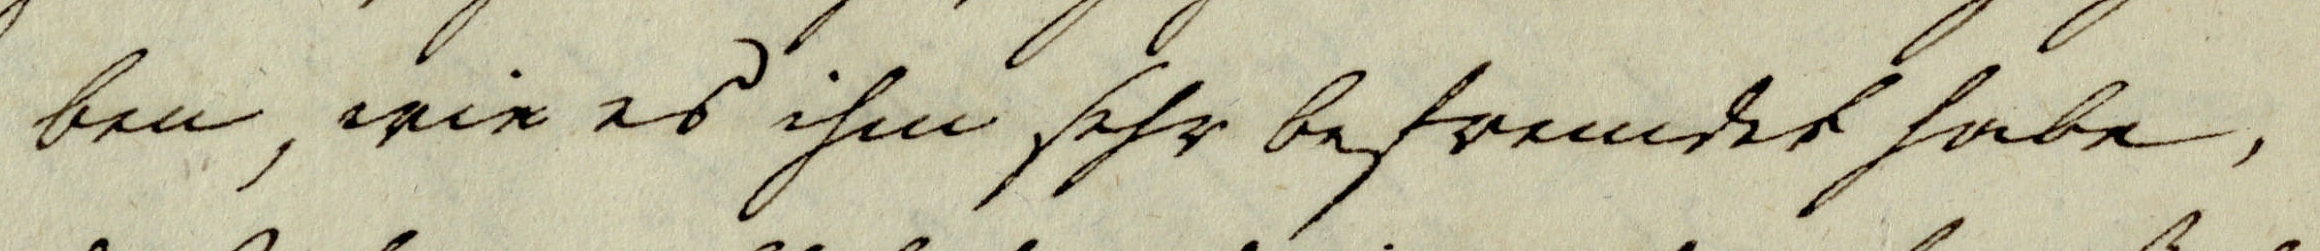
ben wie es ihm sehr befremdet habe,
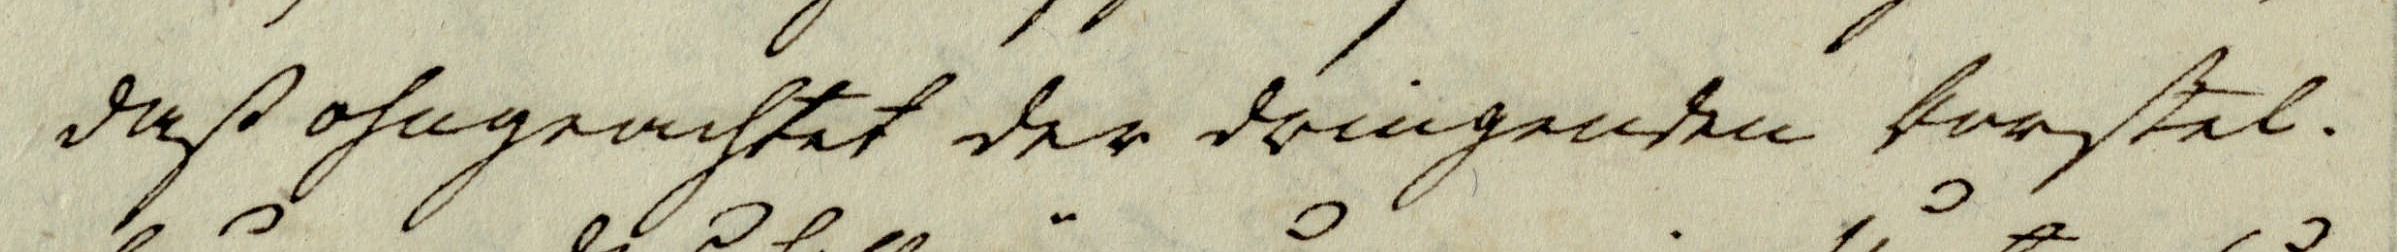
daß ohngeachtet der dringenden Vorstel¬
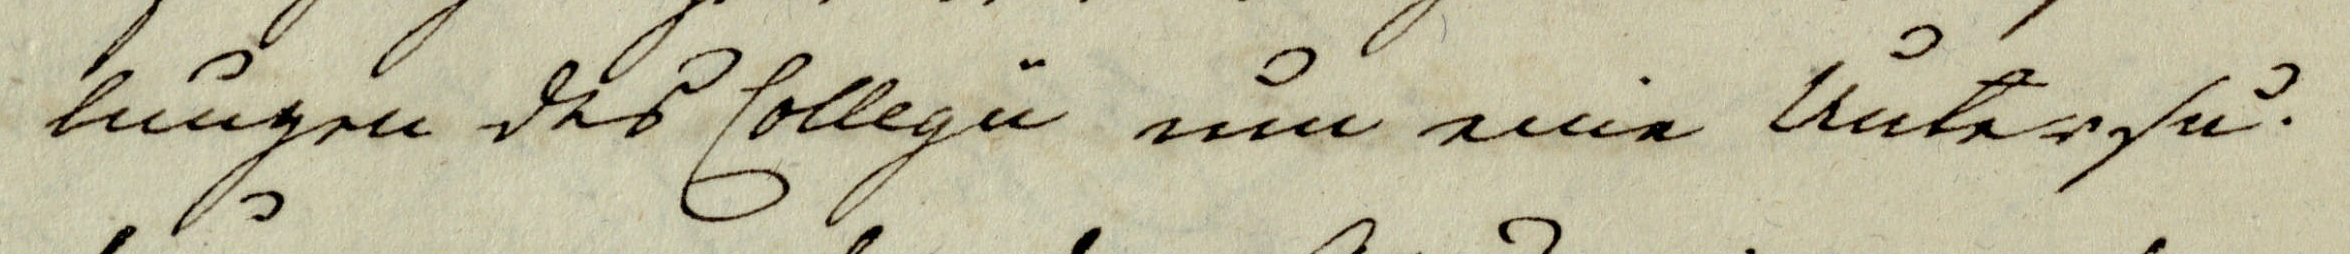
lungen des Collegii um eine Untersu¬
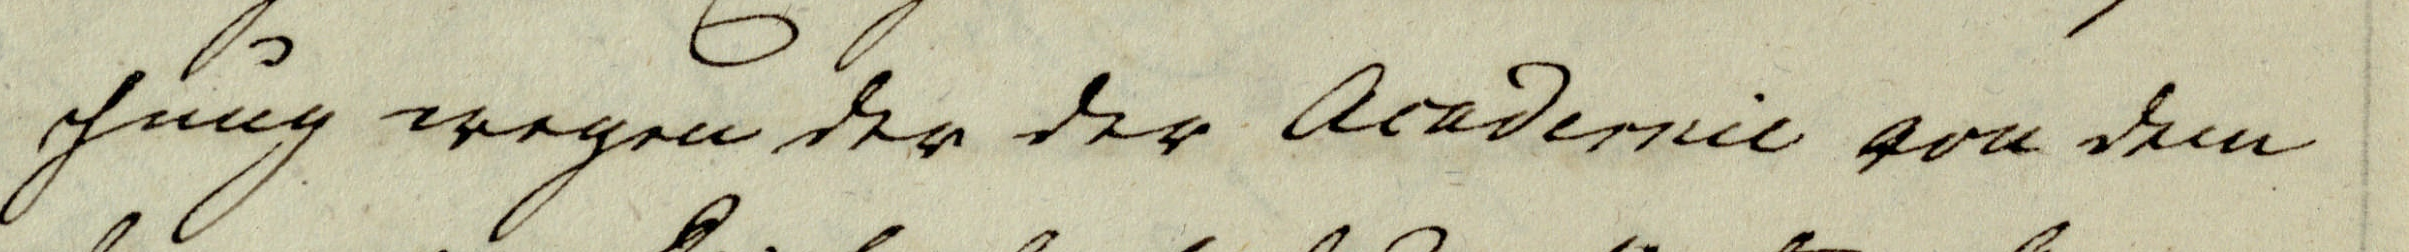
chung wegen der der Academie von dem
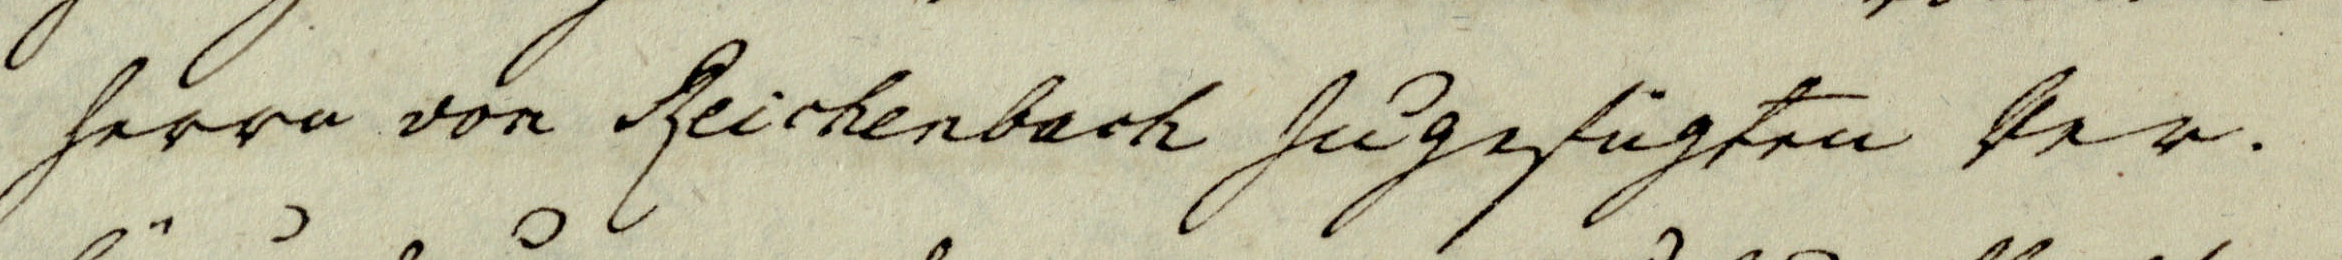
Herrn von Reichenbach zugefügten Ver¬
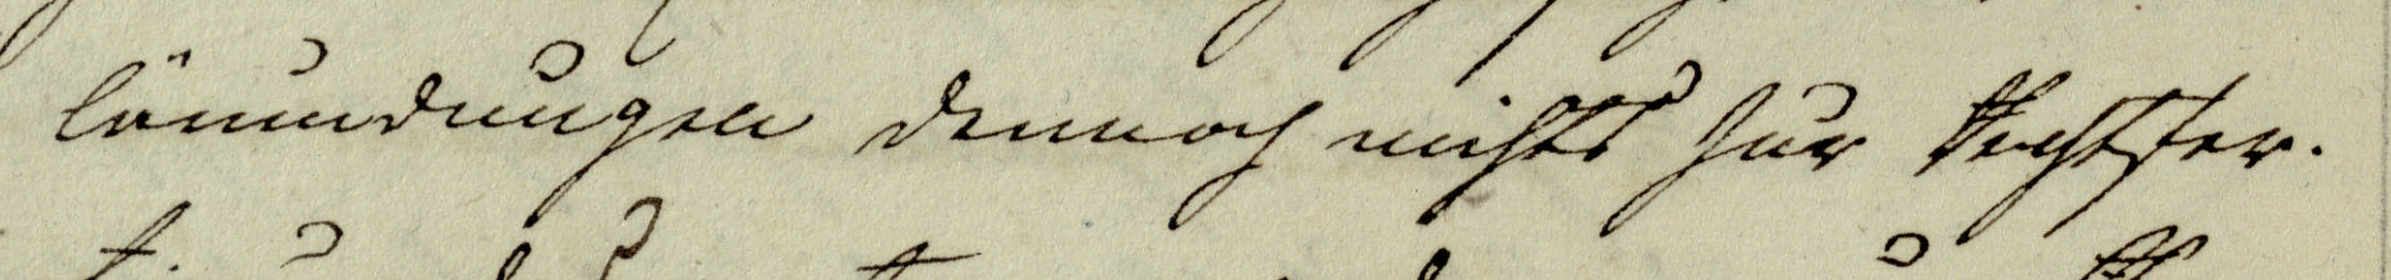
läumdungen dennoch nichts zur Rechtfer¬
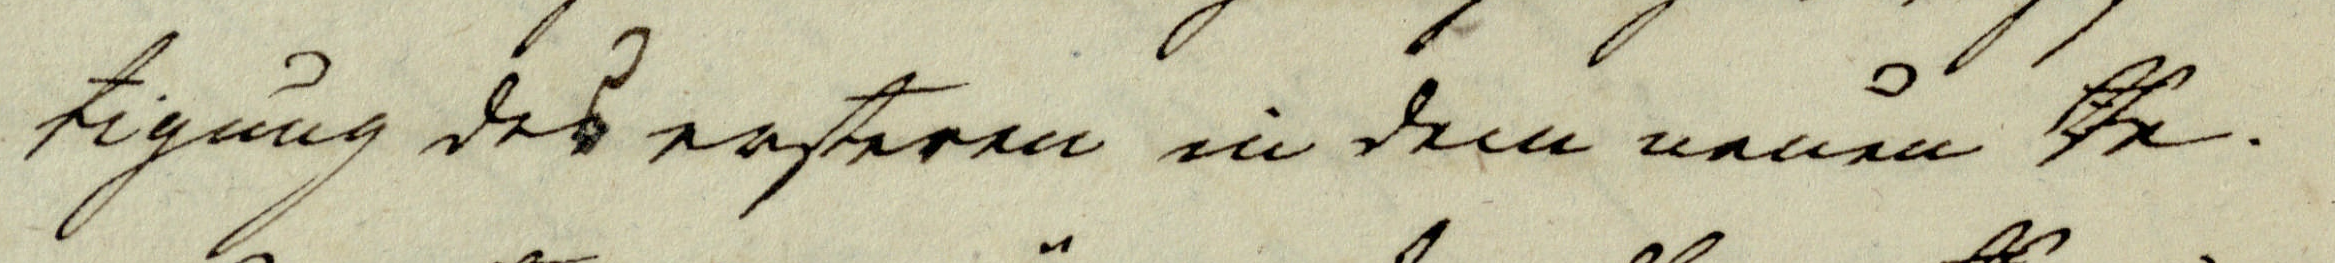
tigung des ersteren in dem neuen Re¬
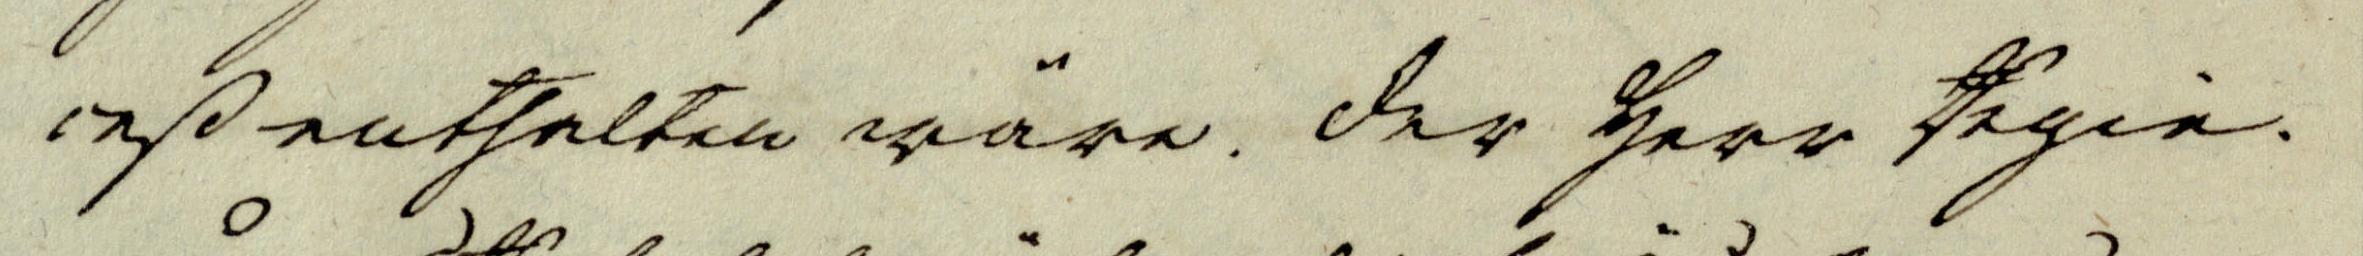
ceß enthalten wäre. Der Herr Regie¬
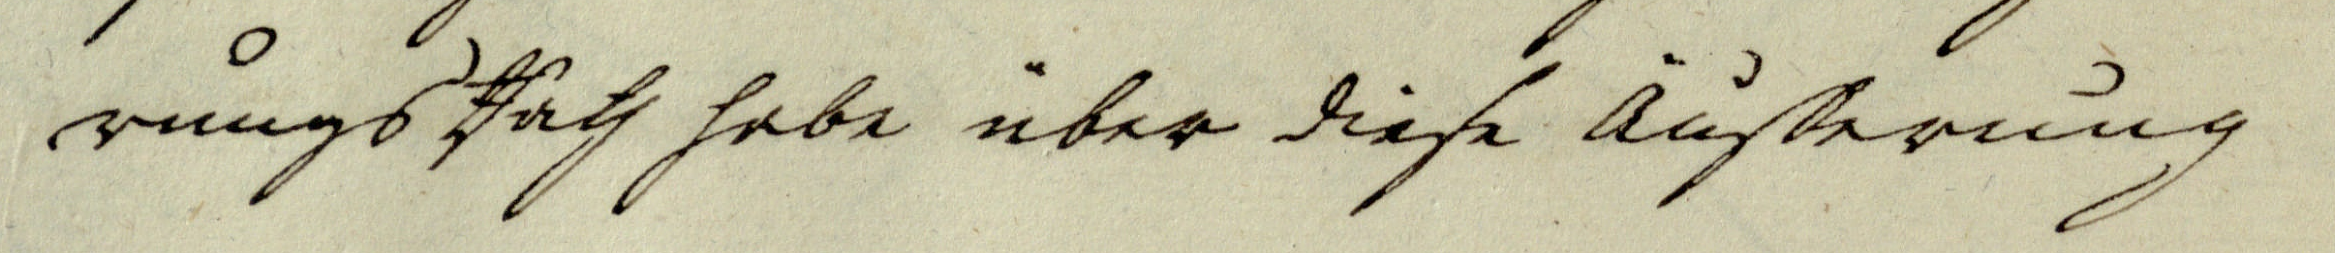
rungs Rath habe über diese Äusserung
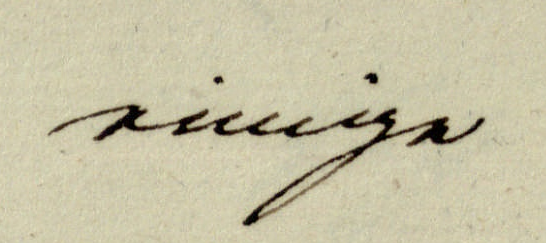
einige
